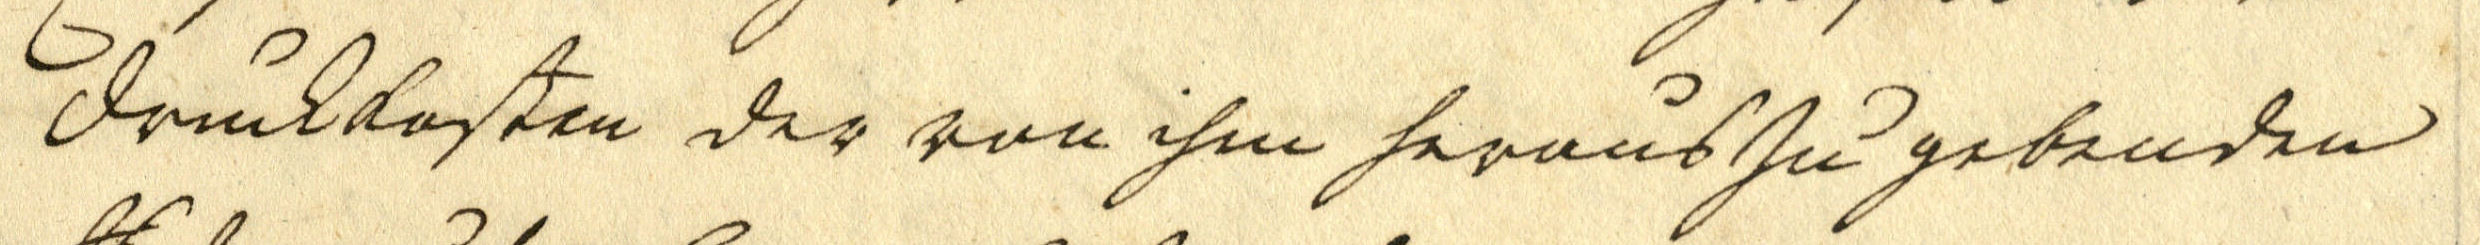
Druckkosten der von ihm heraus zu gebenden
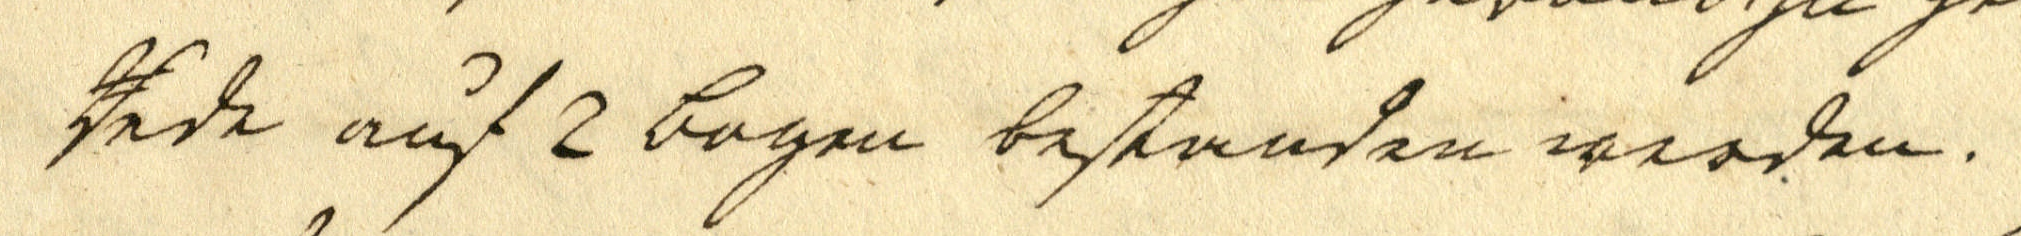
Rede auf 2 Bogen bestanden werden
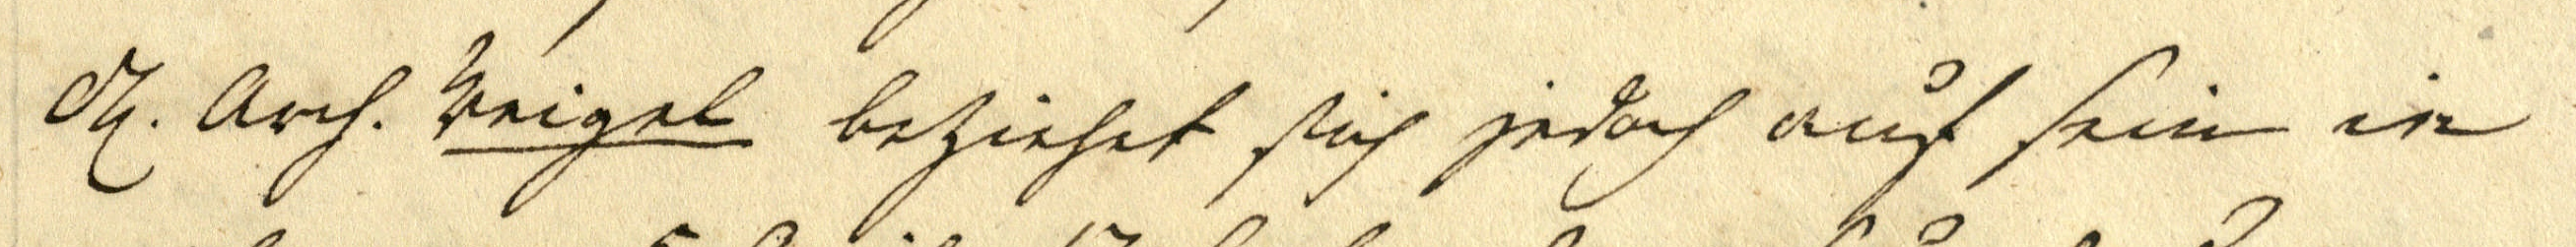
dh. Arch. Weigel beziehet sich jedoch auf sein in
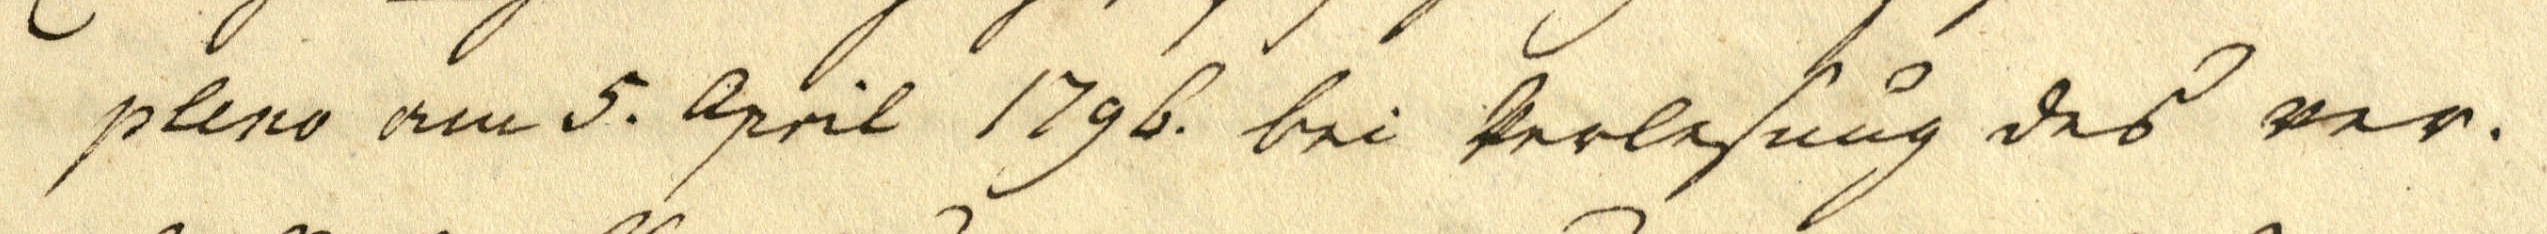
pleno vom 5 . April 1796. bei Verlesung des ver¬
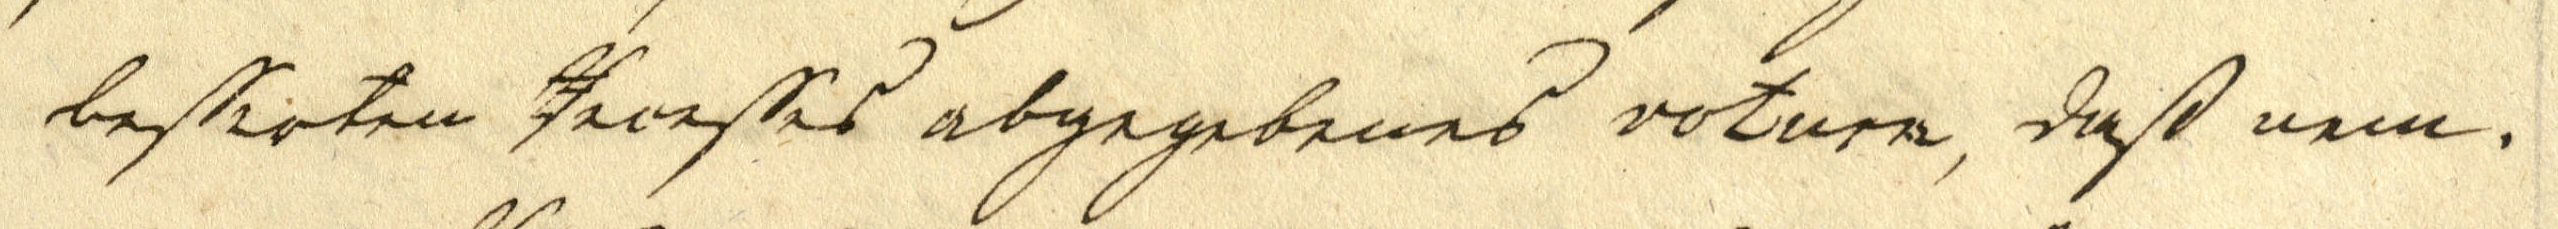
besserten Recesses abgegebenes votum, daß nem¬
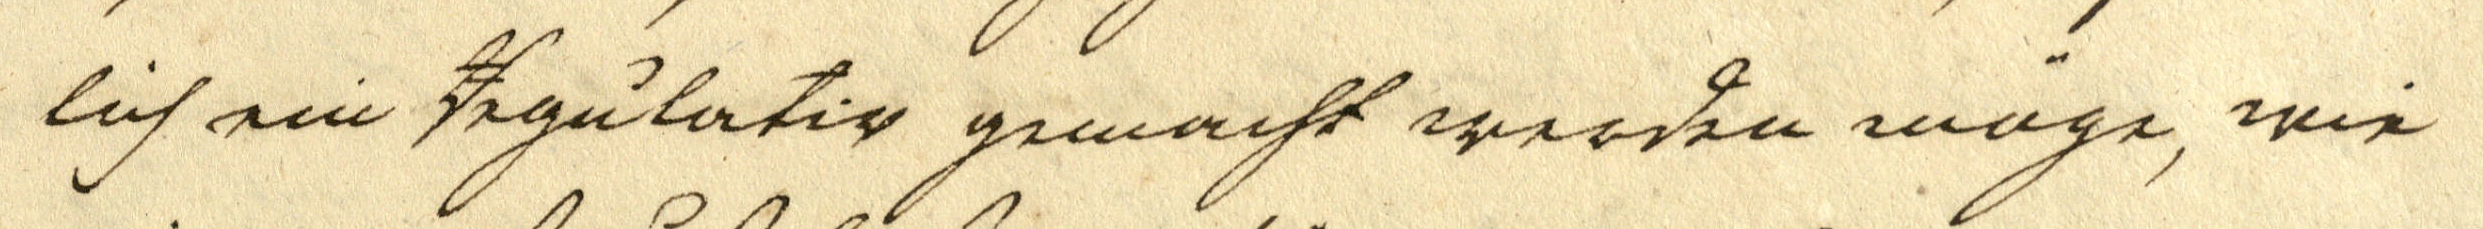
lich ein Regulativ gemacht werden möge, wie
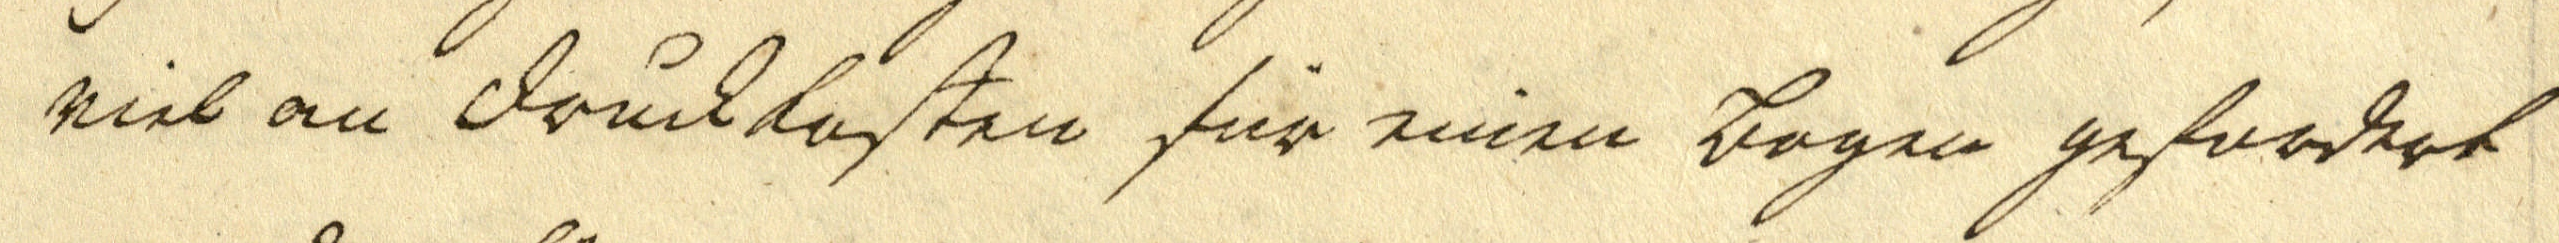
viel an Druckkosten für einen Bogen gefordert
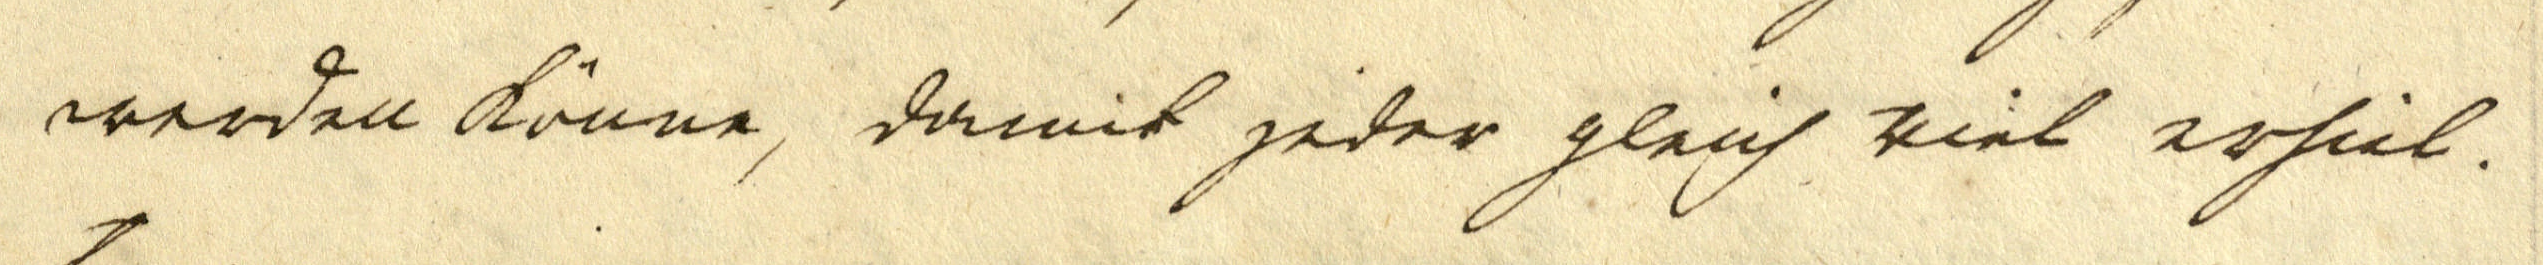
werden könne, damit jeder gleich viel erhiel¬
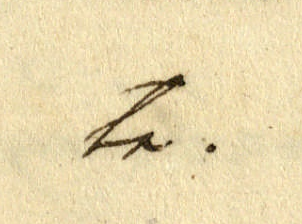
te.
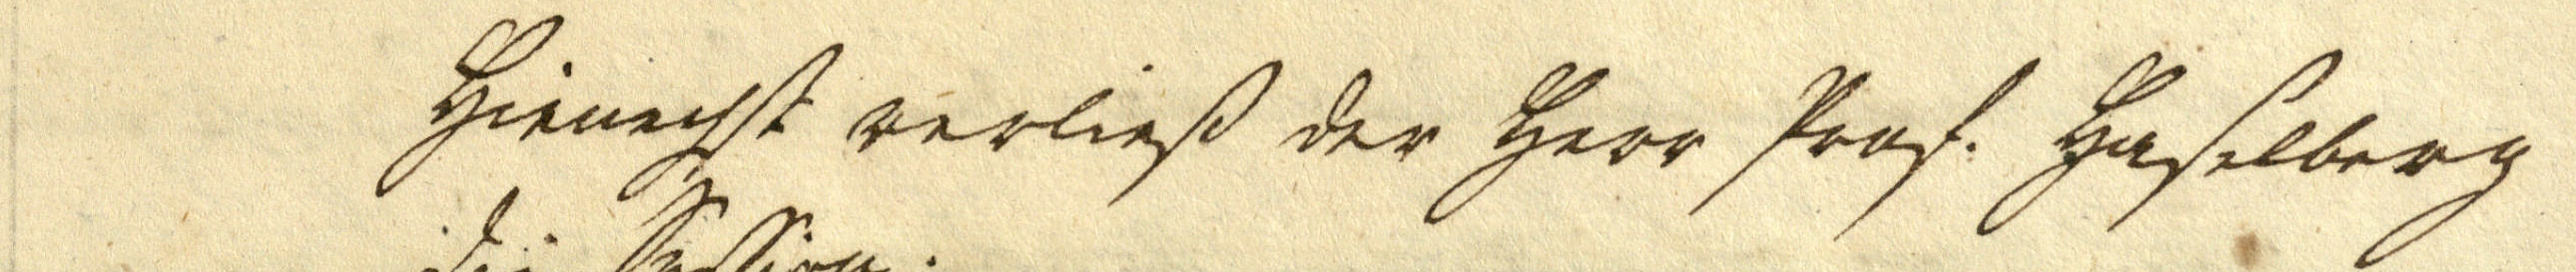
Hienechst verließ der Herr Prof. Haselberg
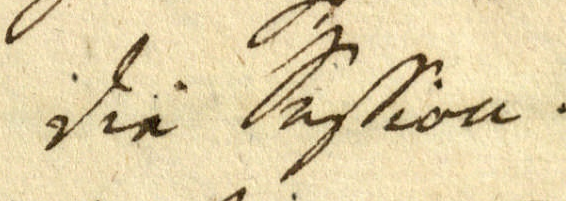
die Session.
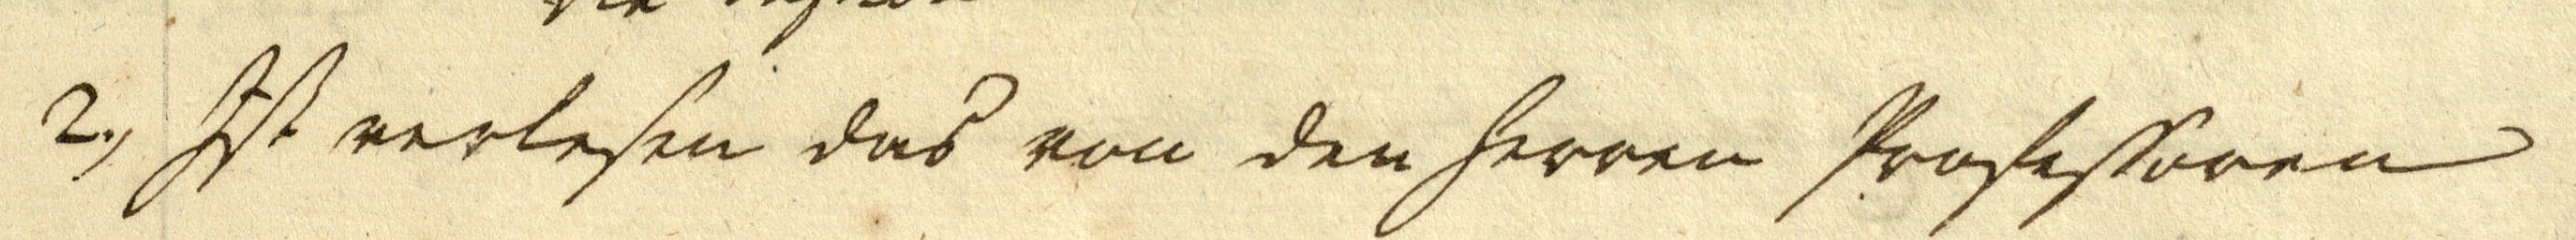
2., Ist verlesen das von den herren Professoren
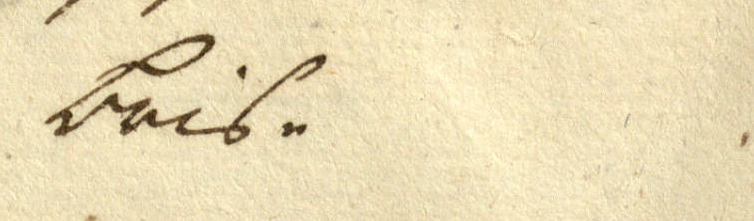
Bris
